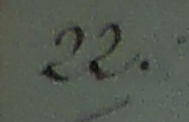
22.
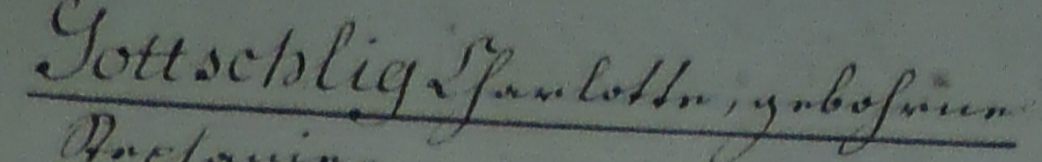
Gottschlig Charlotte, gebohren
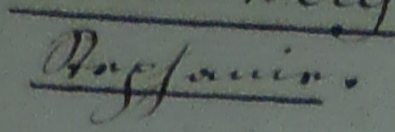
Stephanie.
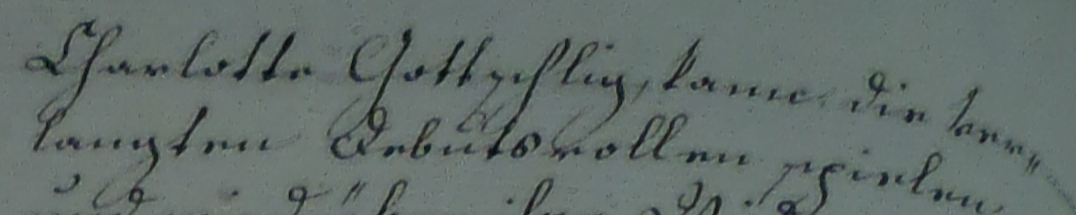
Charlotte Gottschlig, kann die ver¬
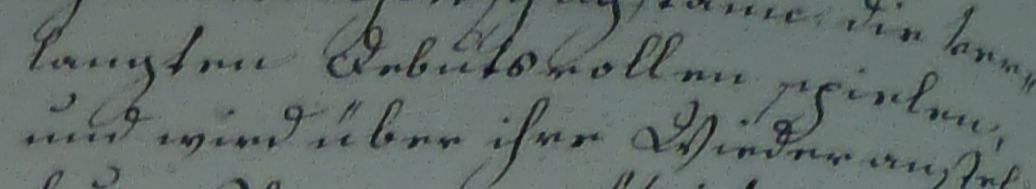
langten Debutsrollen spielen,
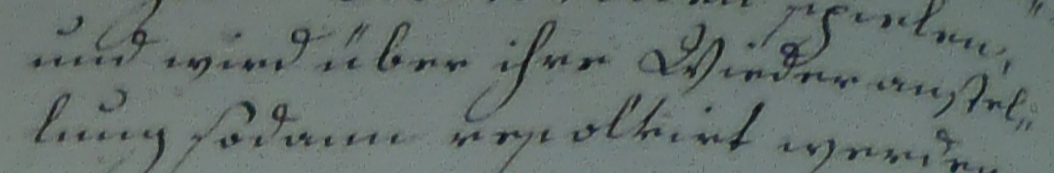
und wird über ihre Wiederanstel¬
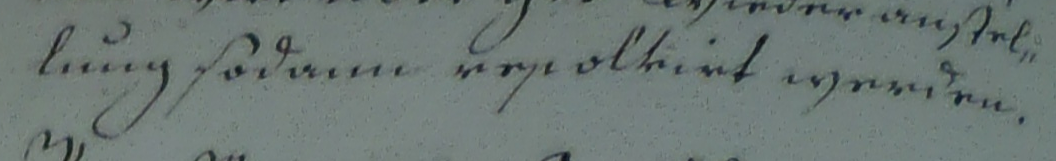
lung sodann resolvirt werden.
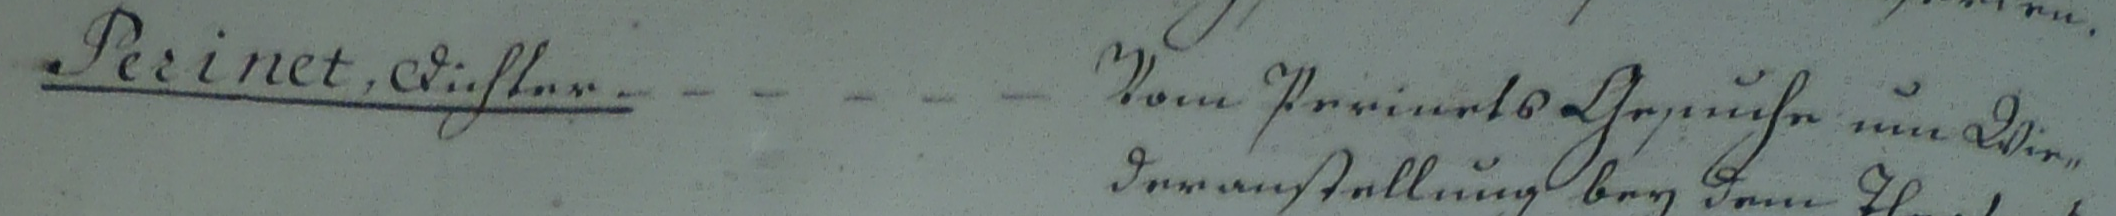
Perinet, Dichter _ _ _ _ _ _ Vom Perinets Gesuche um Wie¬
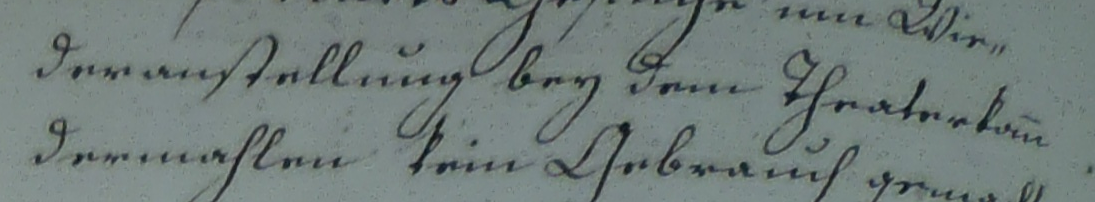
deranstellung bey dem Theaterkan̅
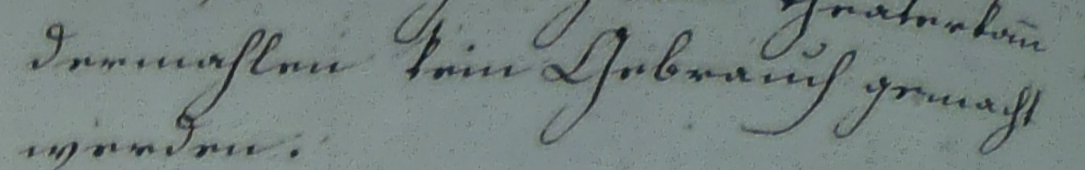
dermahlen kein Gebrauch gemacht
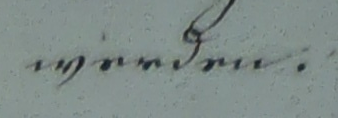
werden.
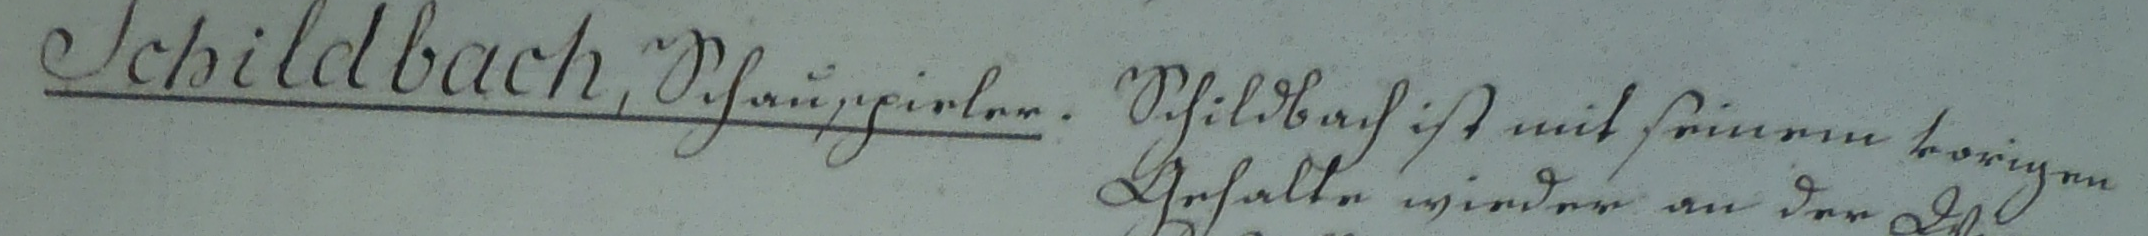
Schildbach, Schauspieler. Schildbach ist mit seinem vorigen
